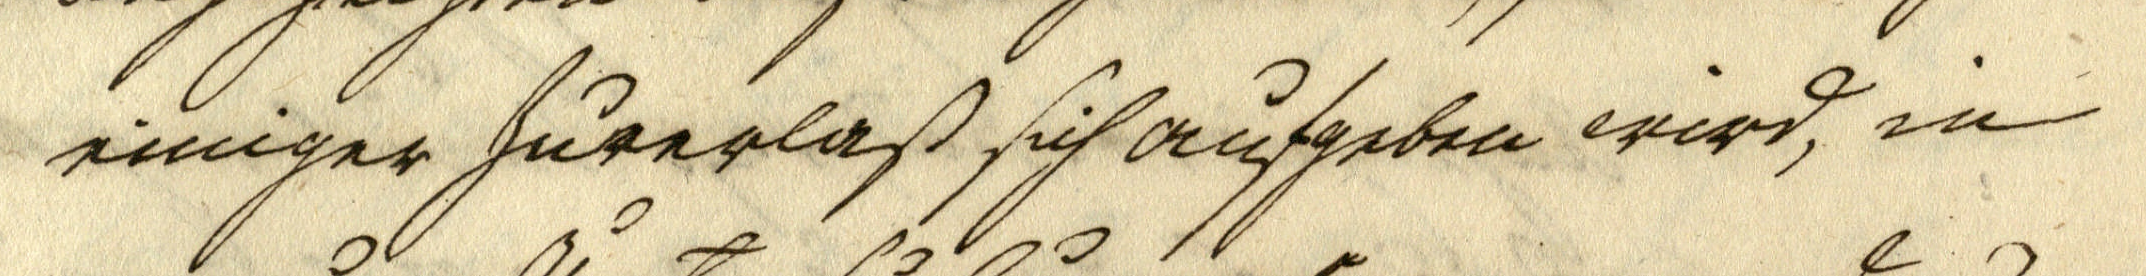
einiger Zuverlaß sich aufgeben wird, in
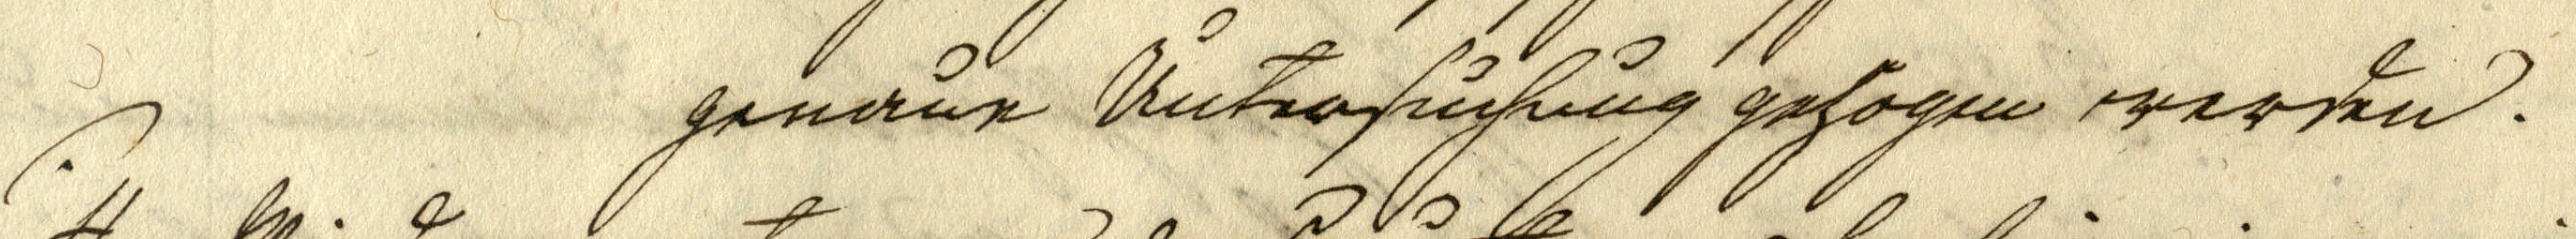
genaue Untersuchung gezogen werden.
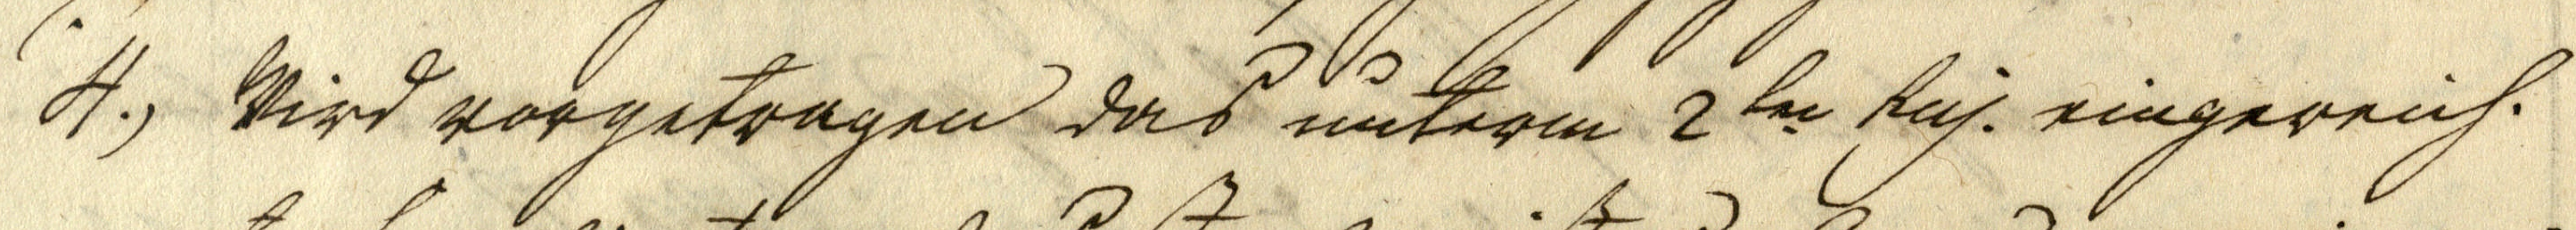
4. Wird vorgetragen das unterm 2ten huj. eingereich-
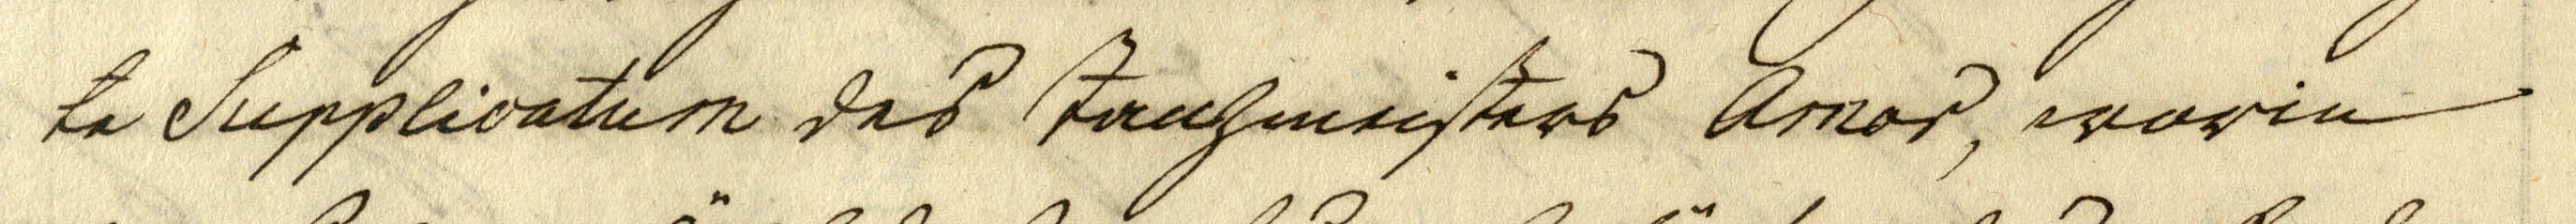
te Supplicatum des Tanzmeisters Amor, worin
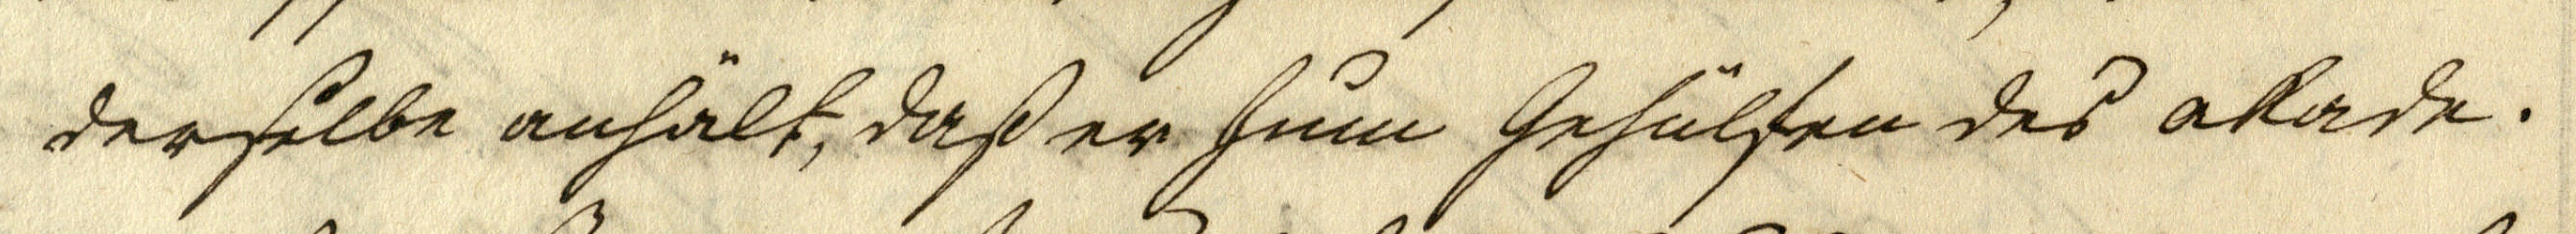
derselbe anhält, daß er zum Gehülfen des akade-
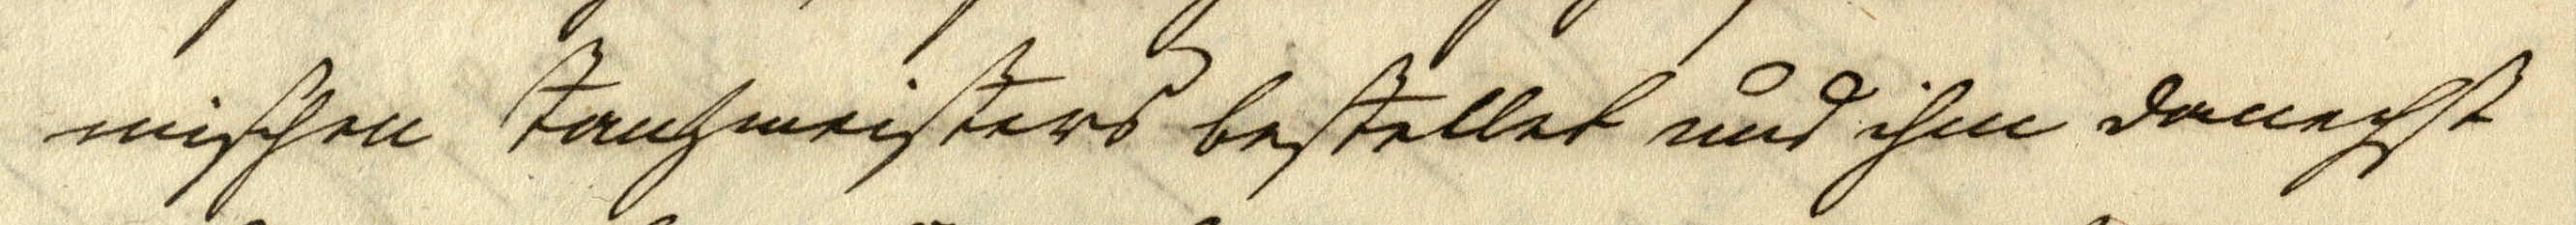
mischen Tanzmeisters bestellet und ihm danechst
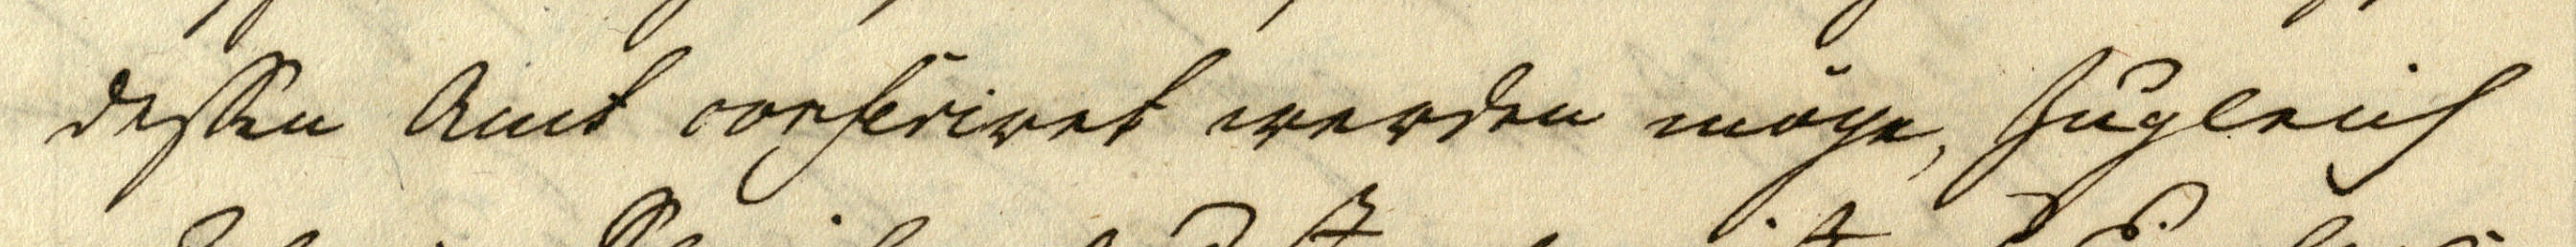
dessen Amt conferiret werden möge, zugleich
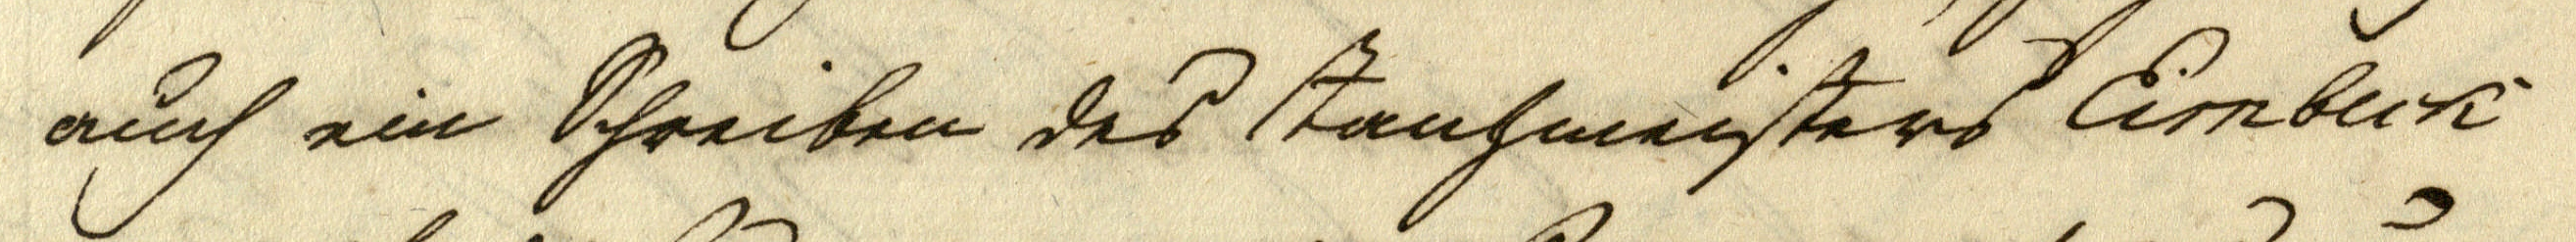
auch ein Schreiben des Tanzmeisters Eimbeck
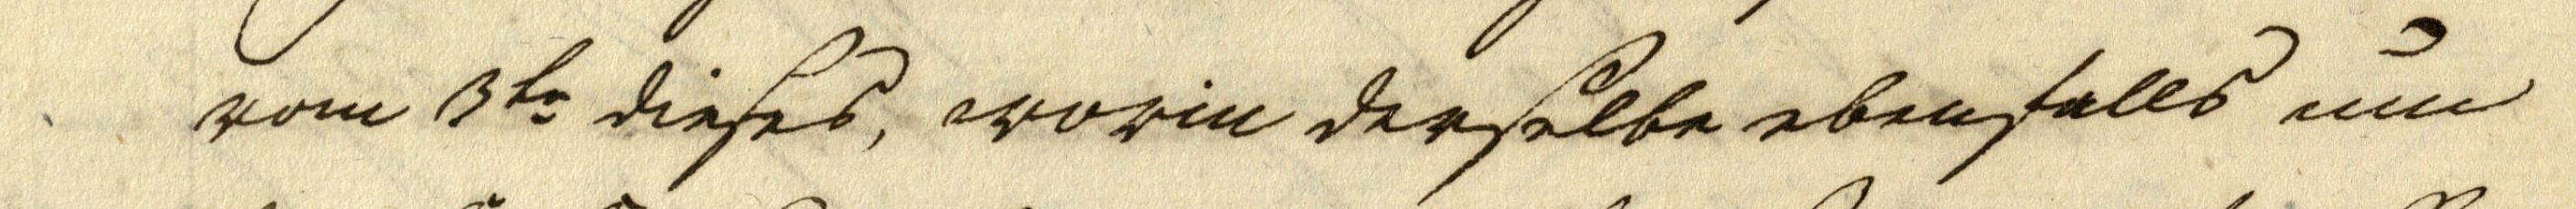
vom 3ten dieses, worin derselbe ebenfalls um
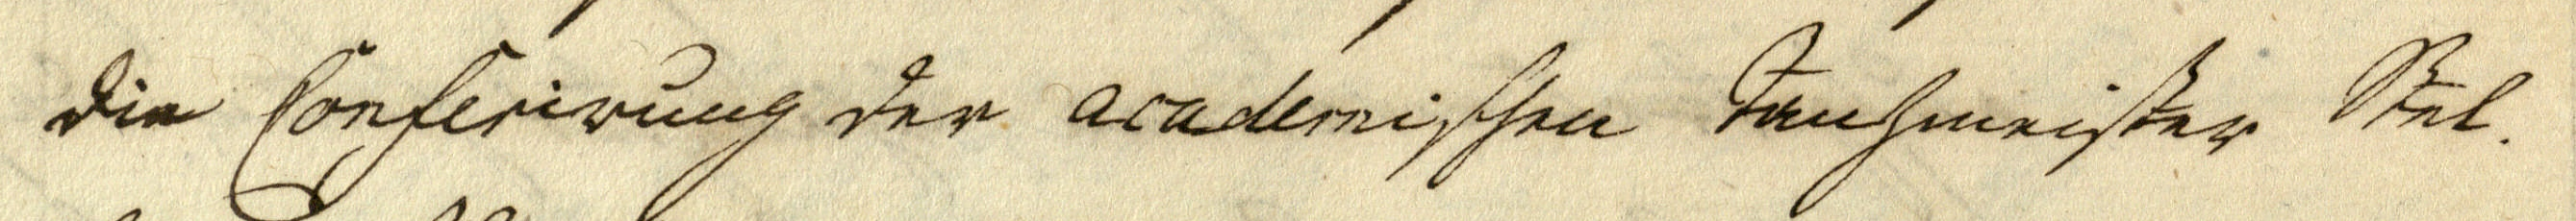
die Conferirung der academischen Tanzmeister Stel-
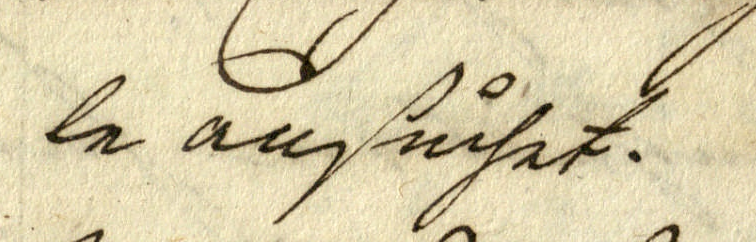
le ansuchet.
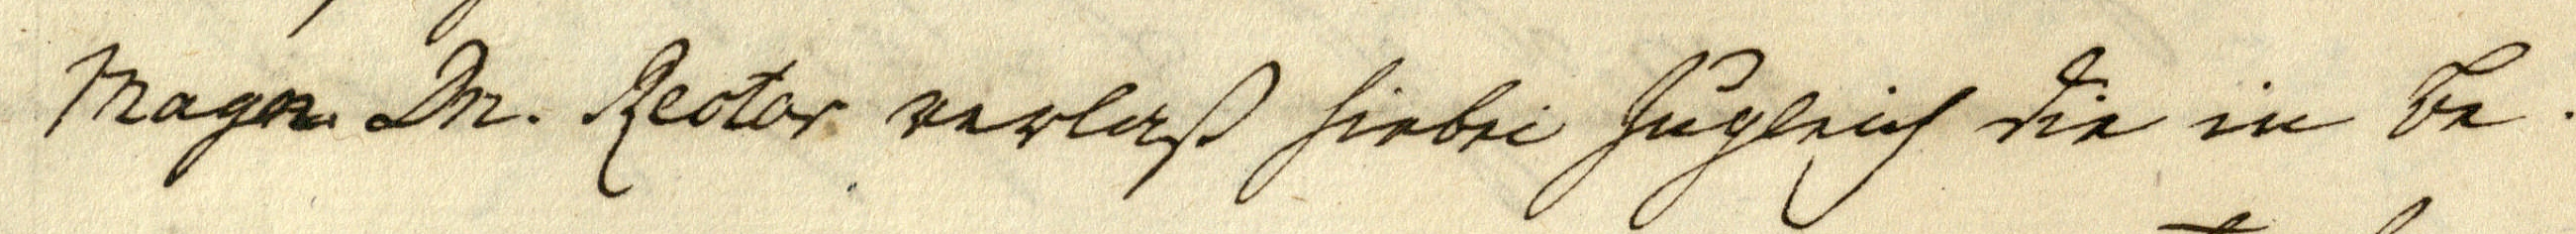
Magn. Dn. Rector verlas hiebei zugleich die in Be-
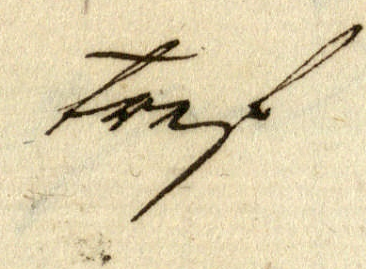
tref
